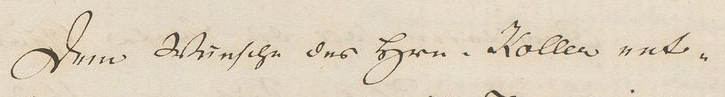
Dem Wunsche des Hrn. Koller ent-
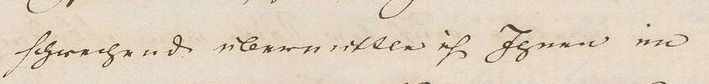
sprechend übermittle ich Ihnen im
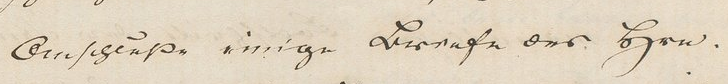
Anschluße einige Briefe des Hrn.
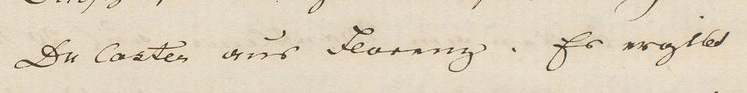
Du Coster aus Florenz. Es ergibt
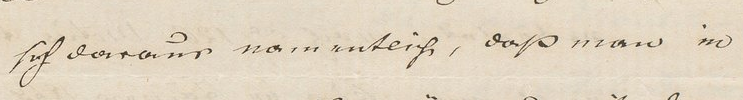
sich daraus namentlich, daß man in
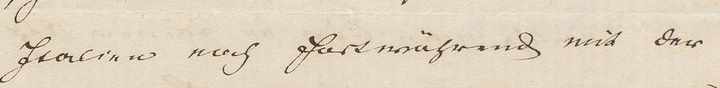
Italien noch fortwährend mit der
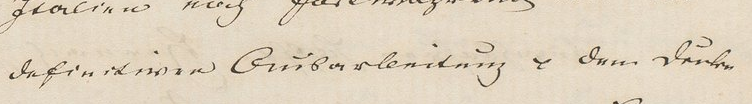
definitiven Ausarbeitung & dem Druke
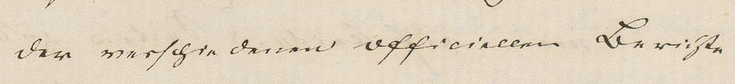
der verschiedenen officiellen Berichte
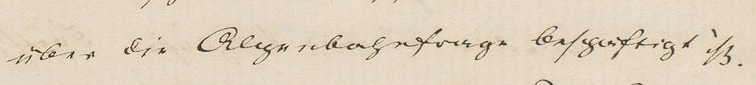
über die Alpenbahnfrage beschäftigt ist.
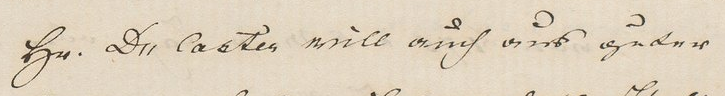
Hr. Du Coster will auch aus guter
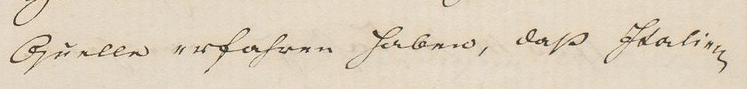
Quelle erfahren haben, daß Italien
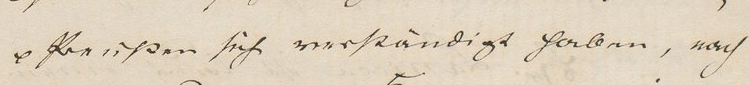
& Preußen sich verständigt haben, nach
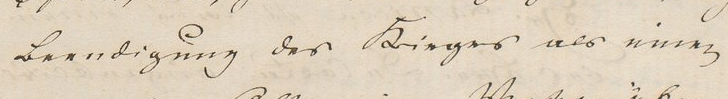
Beendigung des Krieges als einen
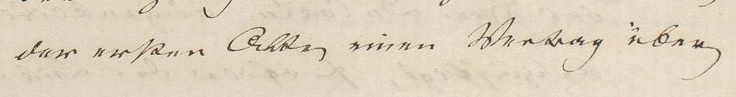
der ersten Akten einen Vetrag über
